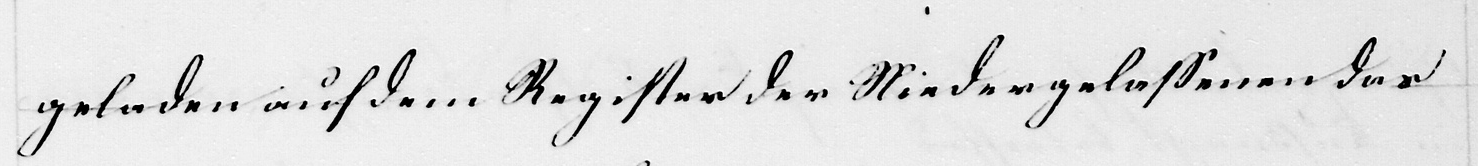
geladen auf dem Register der Niedergelaßenen das
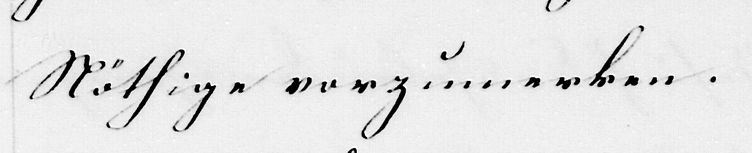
Nöthige vorzumerken.
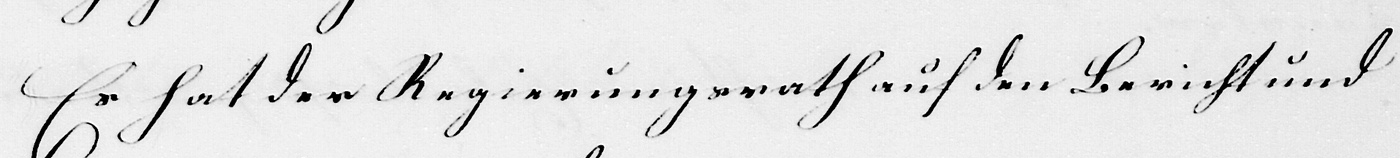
Es hat der Regierungsrath auf den Bericht und
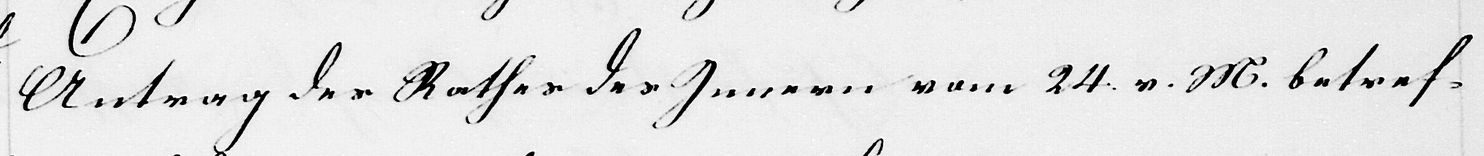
Antrag des Rathes des Innern vom 24. v. M. betref¬
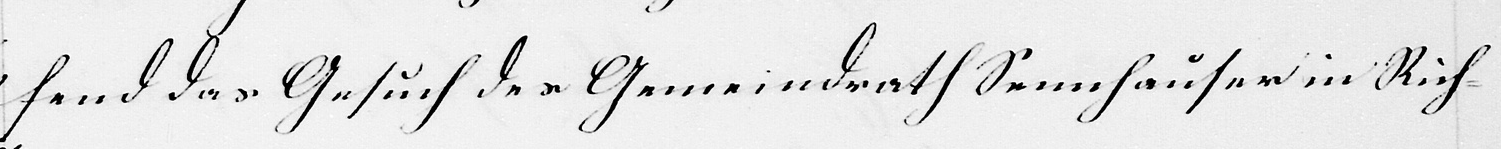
fend das Gesuch des Gemeindrath Sennhauser in Rich¬
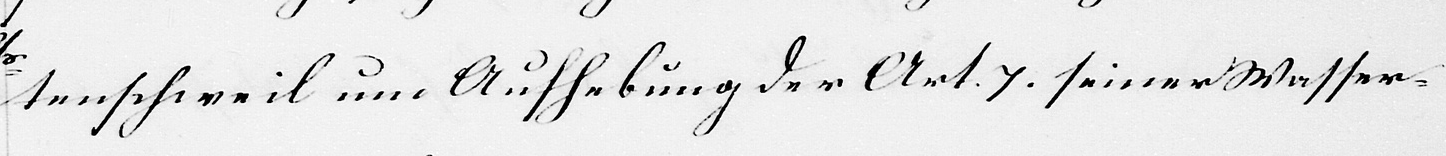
tenschweil um Aufhebung der Art. 7. seiner Wasser¬
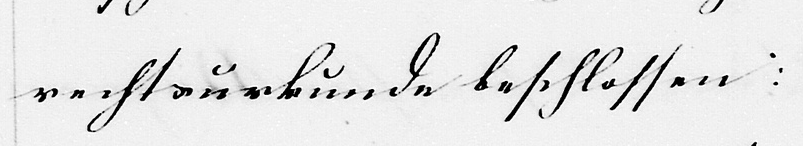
rechtsurkunde beschlossen:
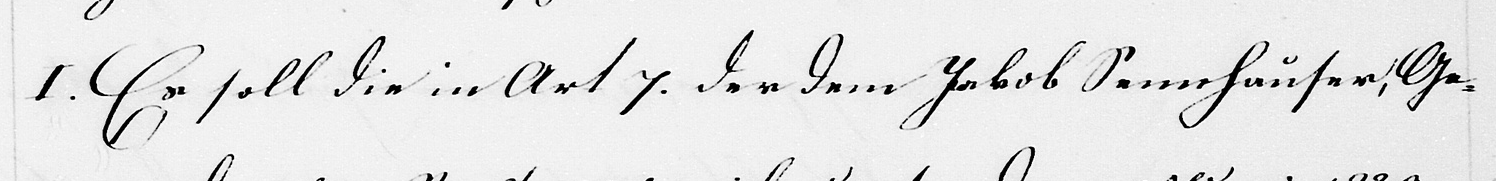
I. Es soll die in Art 7. der dem Jakob Sennhauser, Ge¬
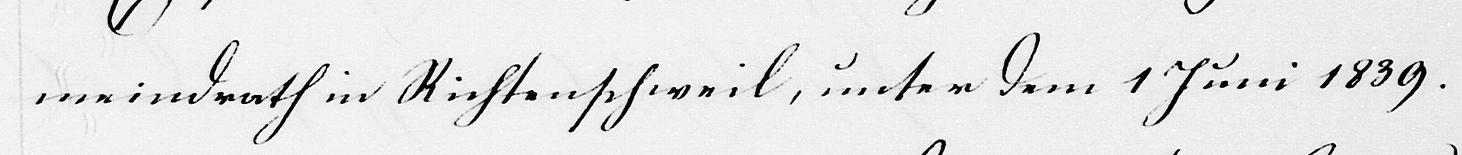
meindrath in Richtenschweil, unter dem 1 Juni 1839.
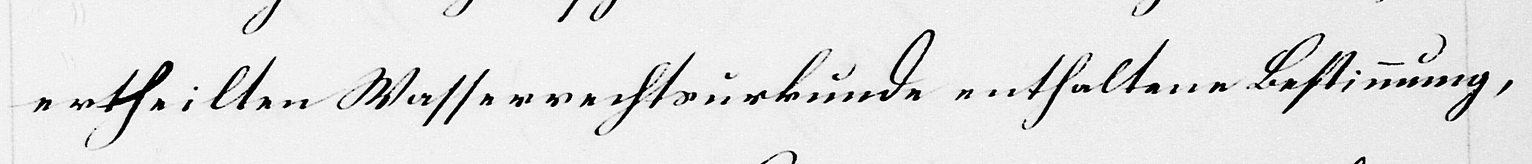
ertheilten Wasserrechtsurkunde enthaltene Bestimmung,
